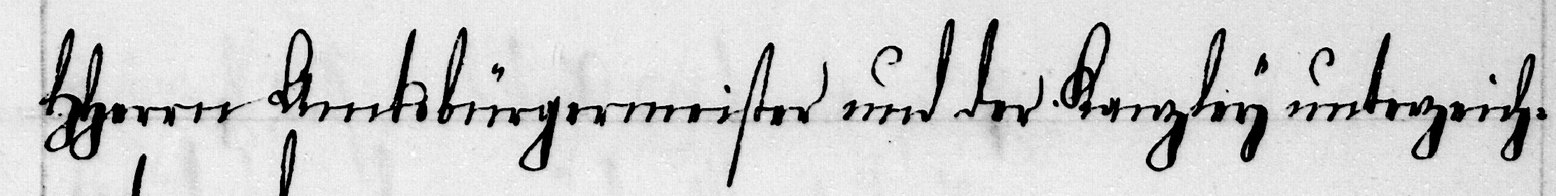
HHerrn Amtsbürgermeister und der Kanzley unterzeich¬
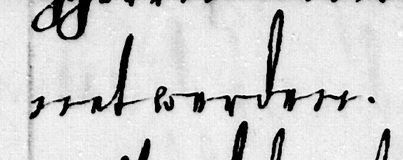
net werden.
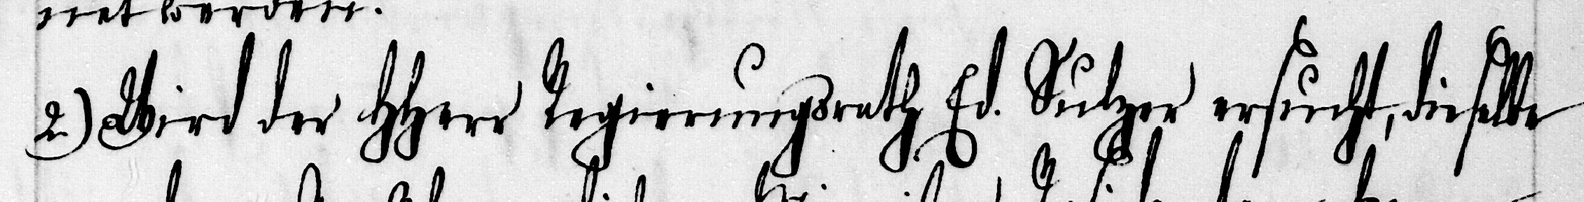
2.) Wird der HHerr Regierungsrath Ed. Sulzer ersucht, diesel¬
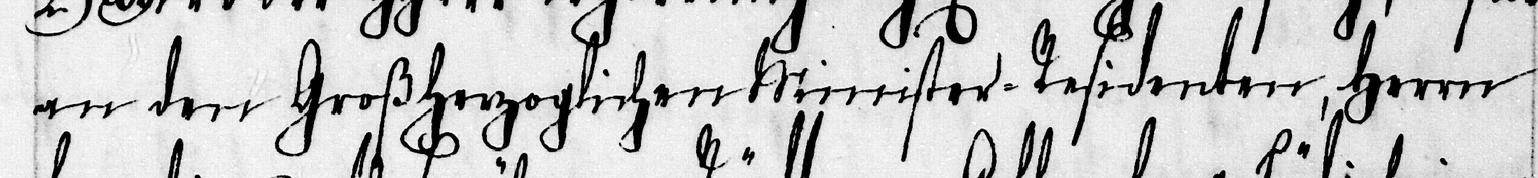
an den Großherzoglichen Minister-Residenten, Herrn
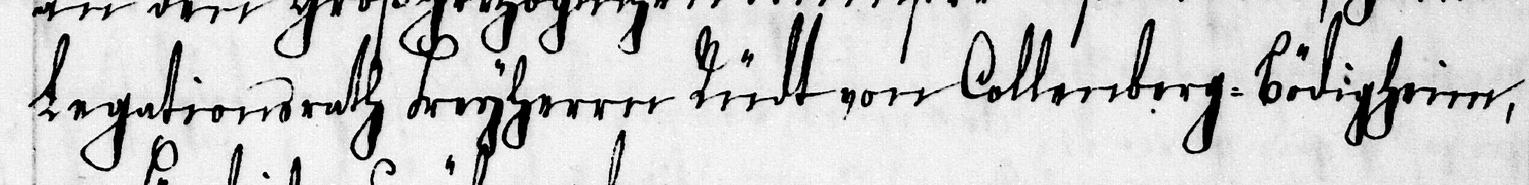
Legationsrath Freyherrn Rüdt von Collenberg-Bödigheim,
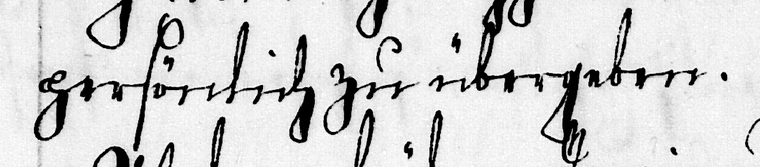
persönlich zu übergeben.
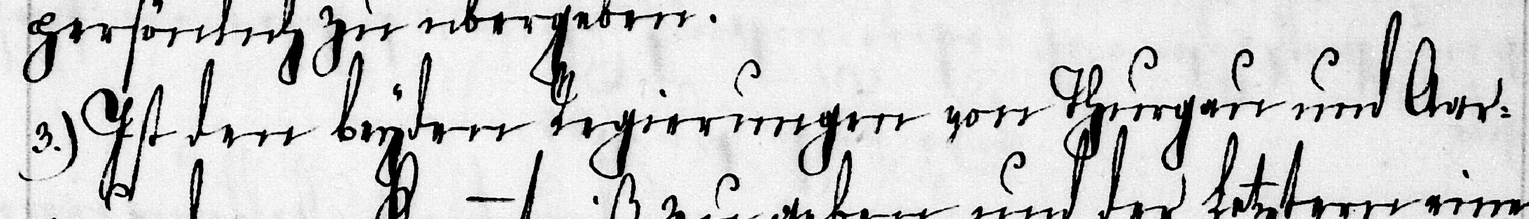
3.) Ist den beyden Regierungen von Thurgau und Aar¬
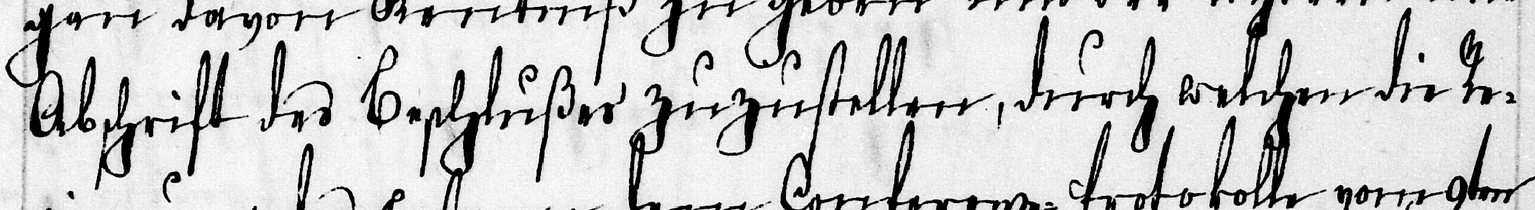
Abschrift des Beschlußes zuzustellen, durch welchen die Re¬
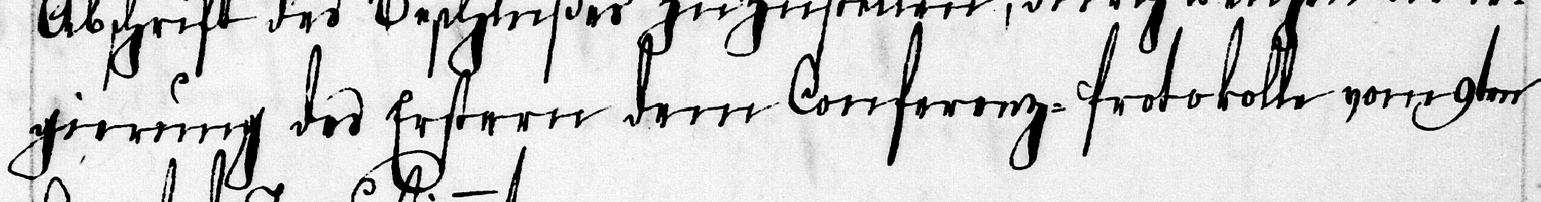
gierung des Erstern dem Conferenz-Protokolle vom 9ten
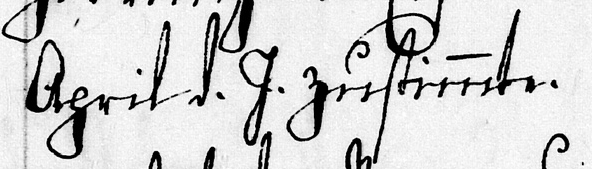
April d. J. zustimmte.
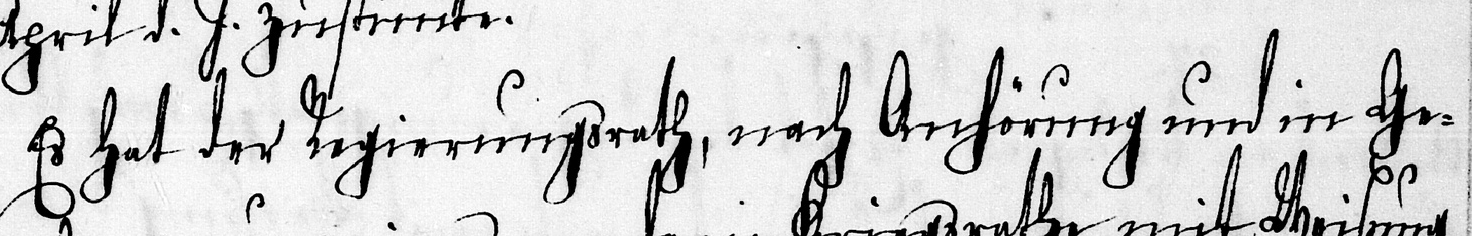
Es hat der Regierungsrath, nach Anhörung und in Ge¬
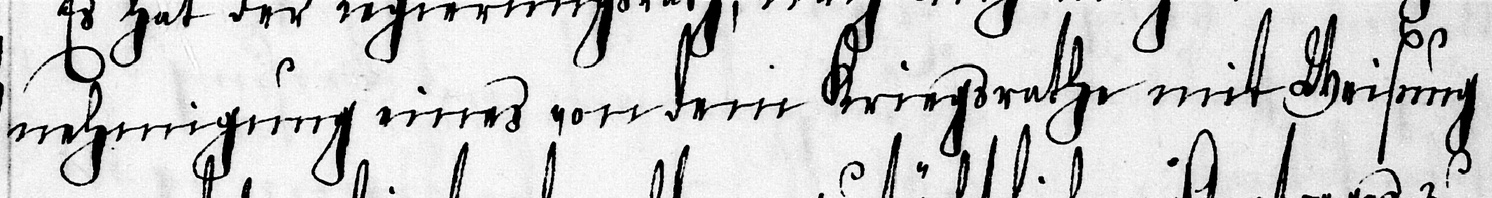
nehmigung eines von dem Kriegsrathe mit Weisung
